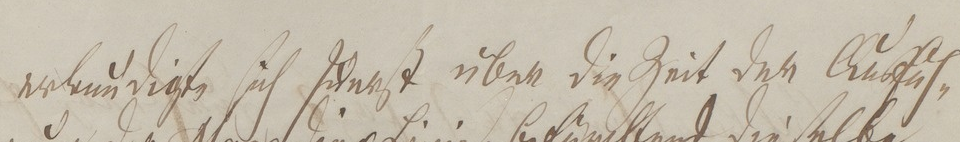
erkundigte sich zuerst über die Zeit der Ausfüh-
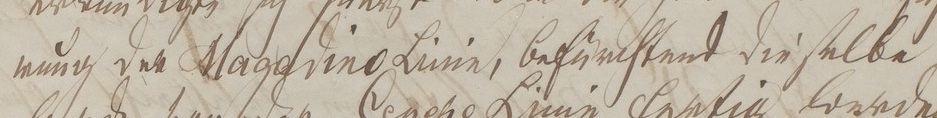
rung der Magadino Linie, befürchtend dieselbe
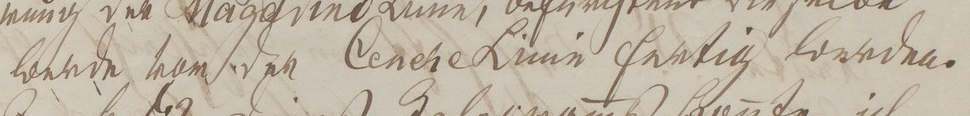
werde vor der Cenere Linie fertig werden.
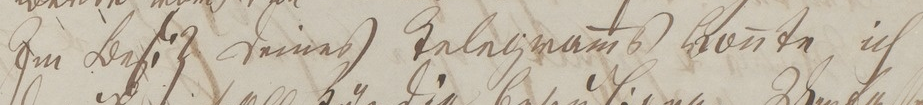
Im Besiz Deines Telegramms konnte ich
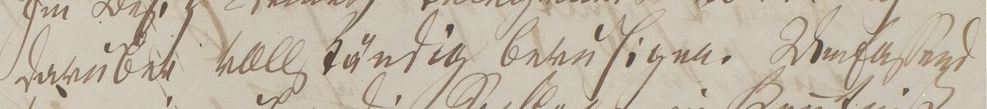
darüber vollstandig beruhigen. Umfassend
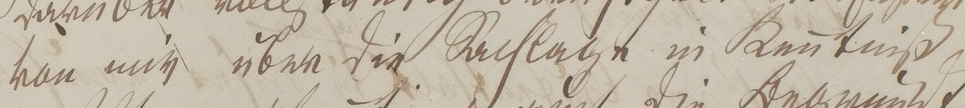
von mir über die Sachlage in Kenntniß
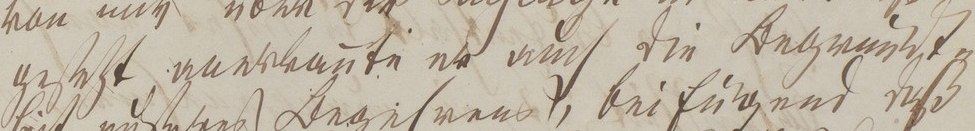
gesezt anerkannte er auch die Begründt-
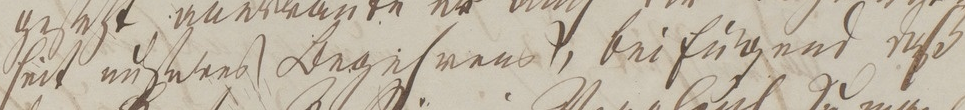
heit unseres Begehrens, beifügend daß
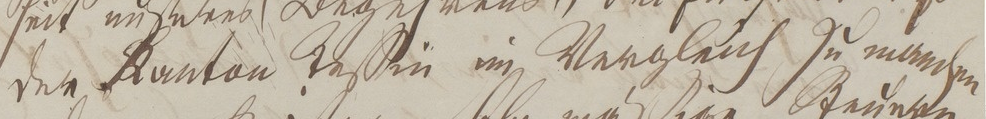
der Kanton Tessin im Vergleich zu manchen
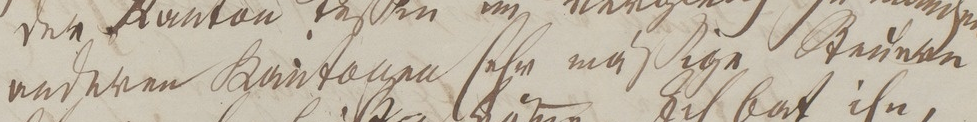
anderen Kantonen sehr mässige Steuern
